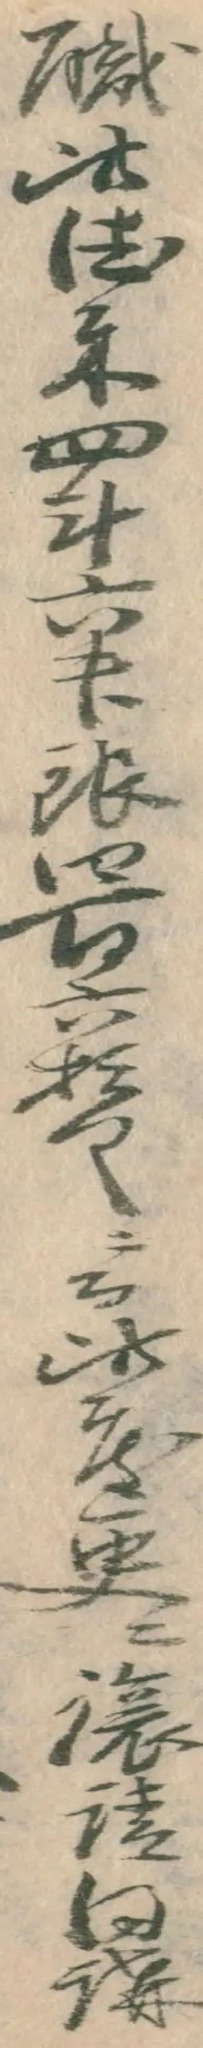職此徳米四斗六升銀四百六拾匁ニ而此度更ニ譲請同講
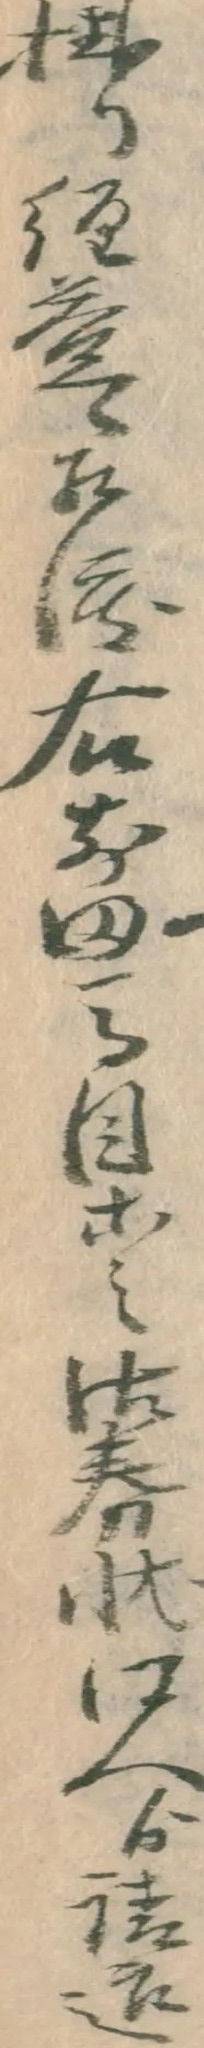掛り経益ヘ相渡右前田馬目等之沽券状同人ゟ請取也

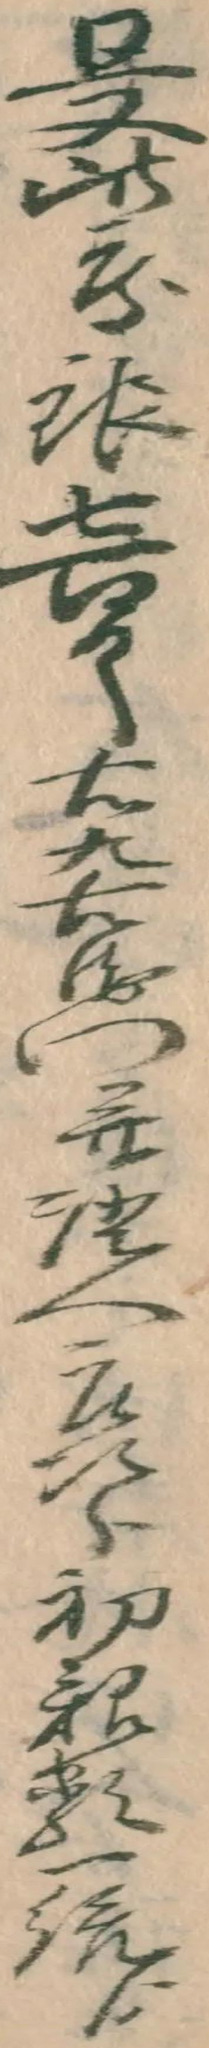且又此度銀七百匁右九右衛門并證人庄次郎初親類一統ゟ
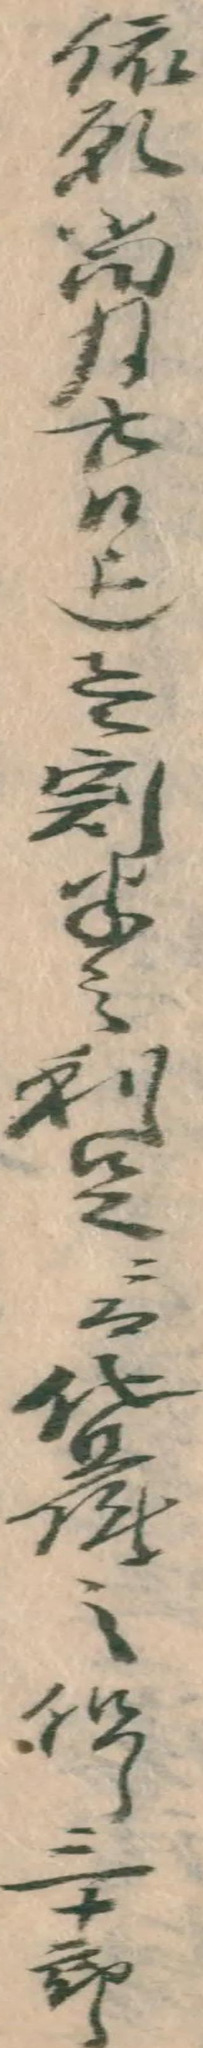依願當月廿日迄壱割半之利足ニ而貸附也但し三十郎
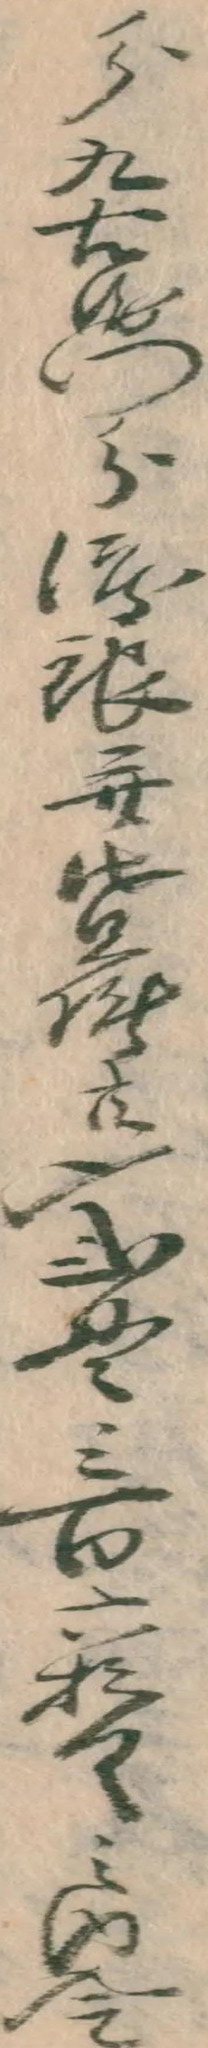分九左衛門分渡銀幷貸代足附共〆弐貫三百六拾匁之内金
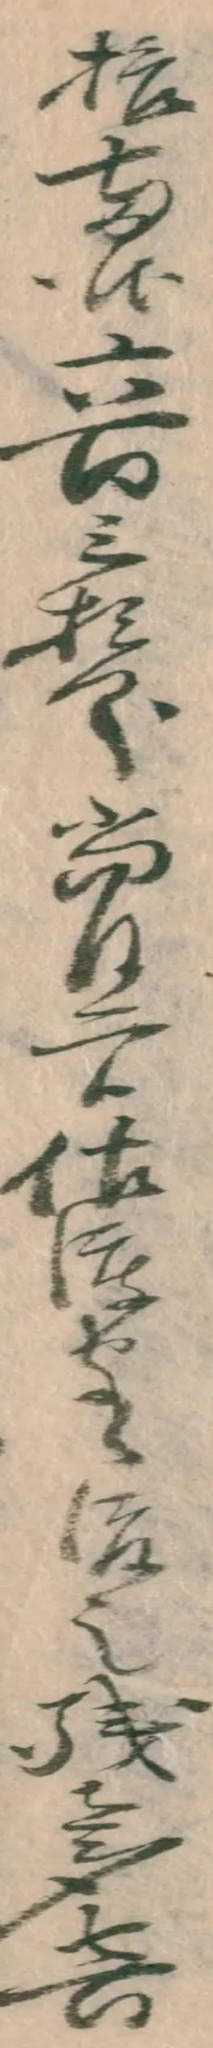拾両弐六百三拾匁當月二日佐渡守へ渡之残壱〆七百
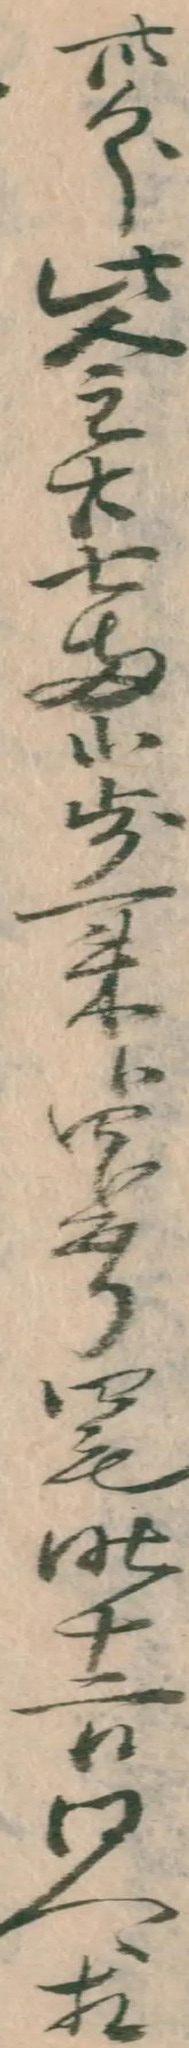弐匁此金廿七両弐歩一朱と四分五り四毛昨十二日同人へ相
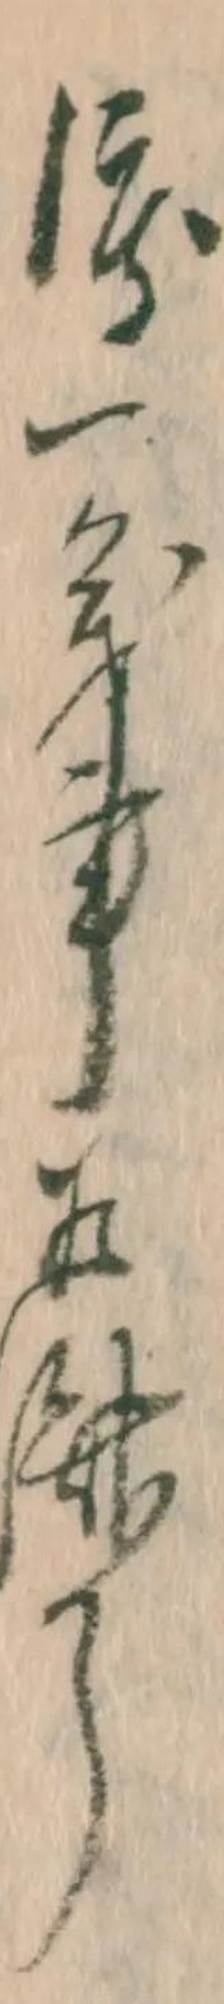渡一義事相済了
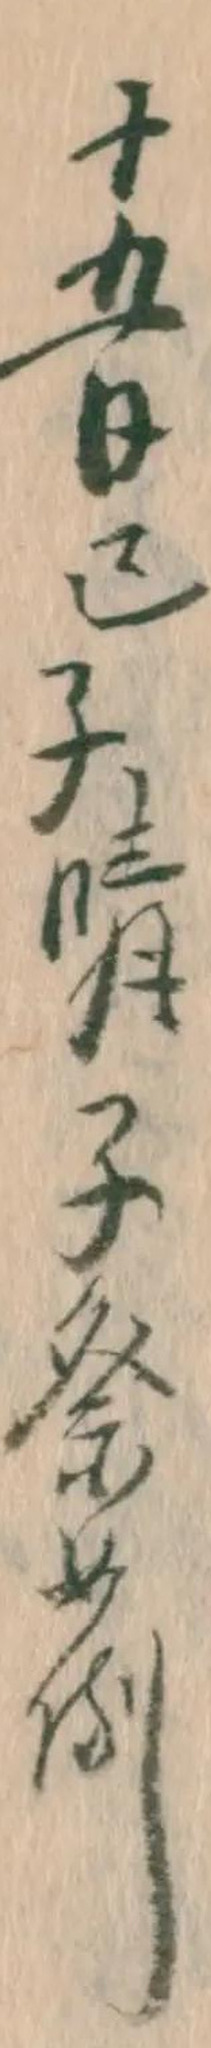十五日己子大風子祭如例
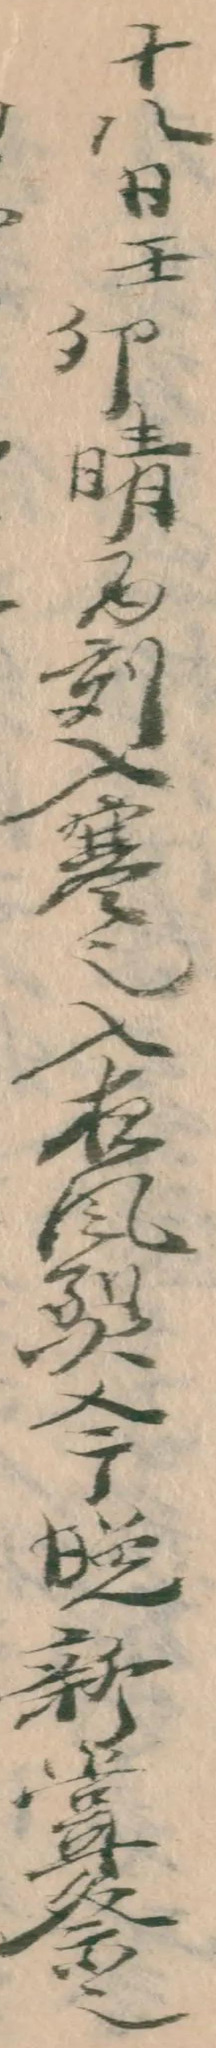十八日壬卯晴酉刻入寒也入夜風烈今晩新嘗祭也
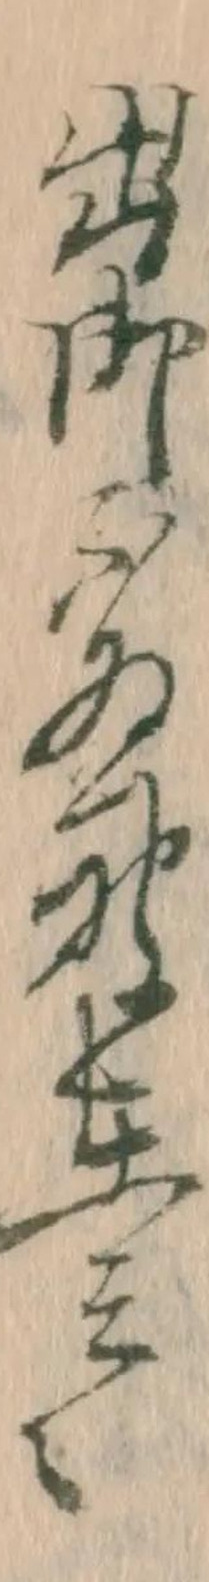出御不為神在云々
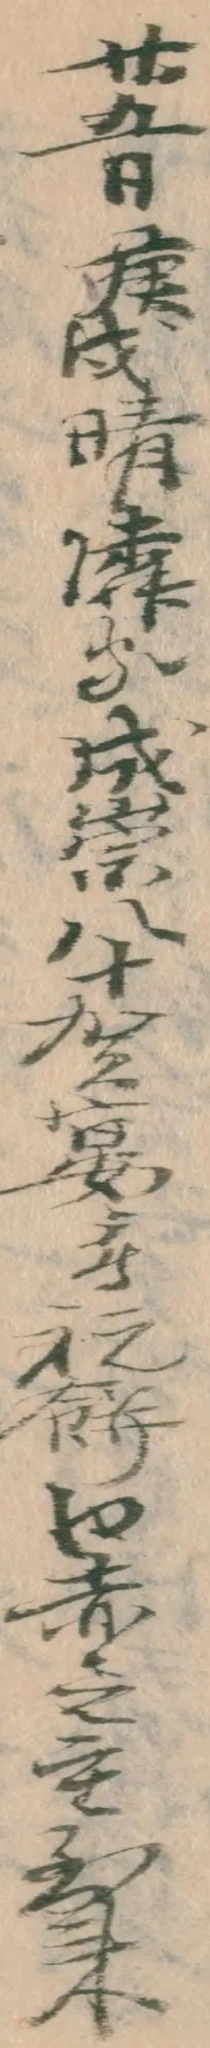廿五日庚戌晴隣家成祟八十賀宴ニ付祝餅白赤之重到来
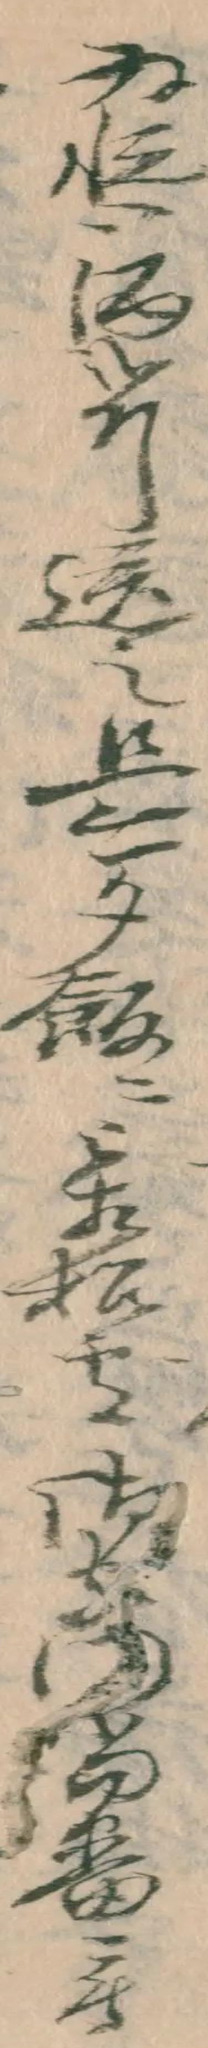為祝御酒弐升送之且今夕飯ニ被相招處御家門當番ニ付
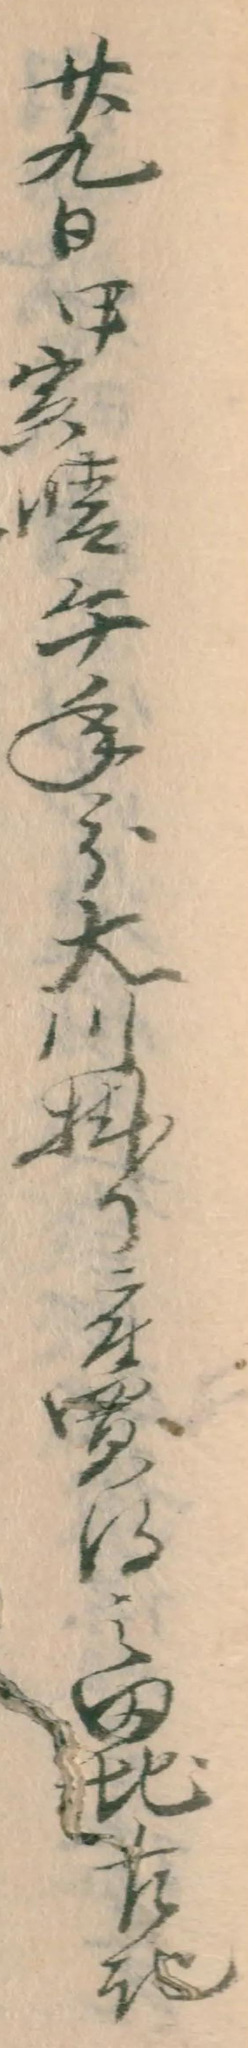廿九日甲寅晴午年分大川掛りニ付買得之田地左記
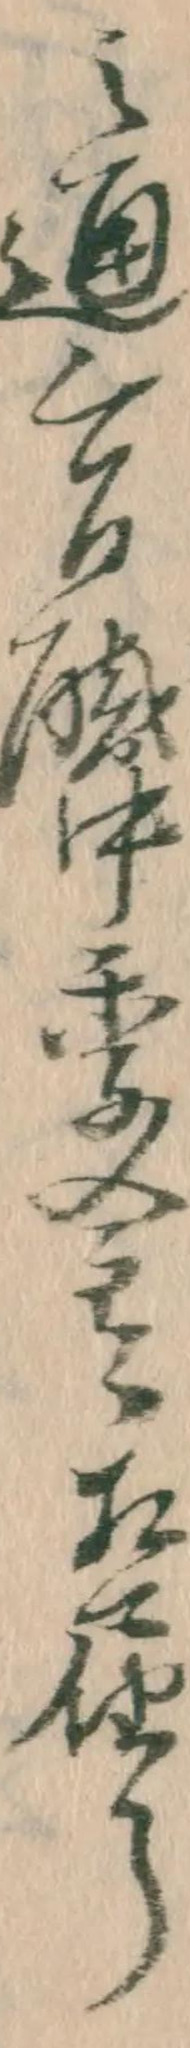之通今日職中季久被為相届了

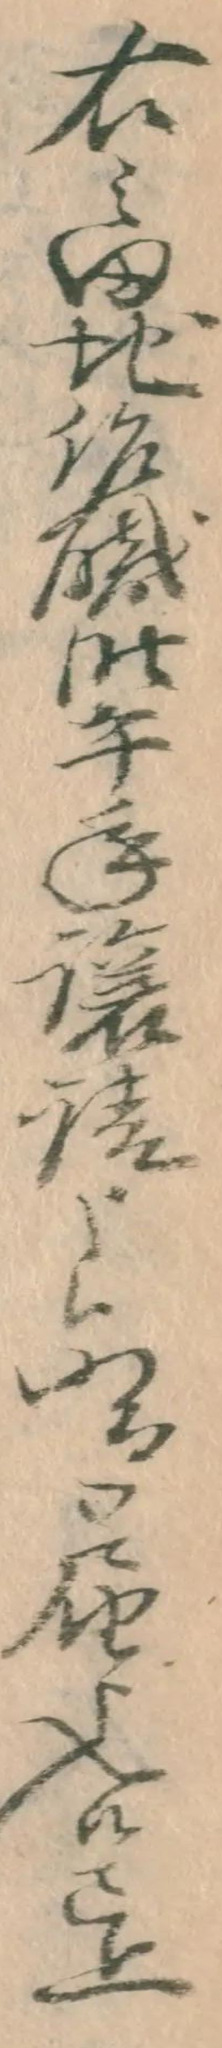右之田地作職昨午年譲請申候仍而御届申入候已上
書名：賀茂社記録. 第67冊
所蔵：国立国会図書館 National Diet Library, JAPAN
